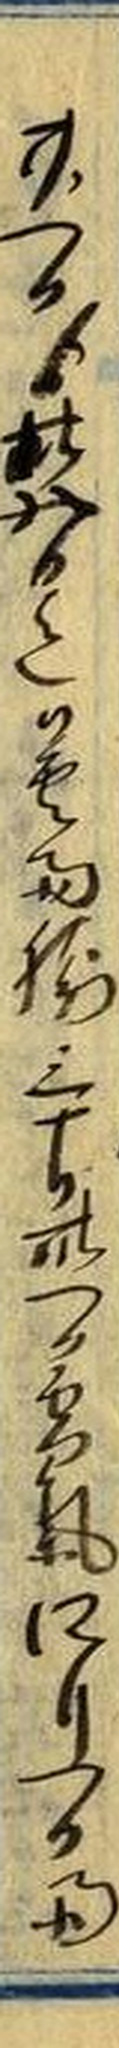廿一日ゟ廿八日迄曇雨勝三十日卅一日雪気四月一日雨
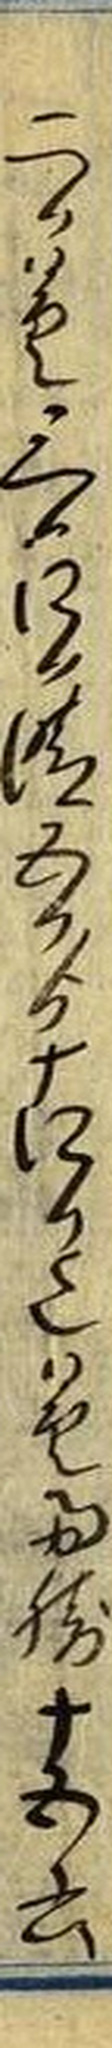二日曇三日四日晴五日ゟ十四日迄曇雨勝十五六
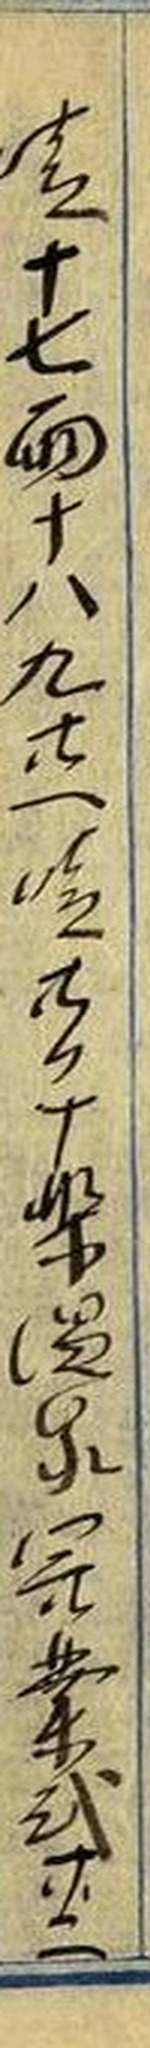晴十七雨十八九廿一晴廿日十楽温泉開業式廿二
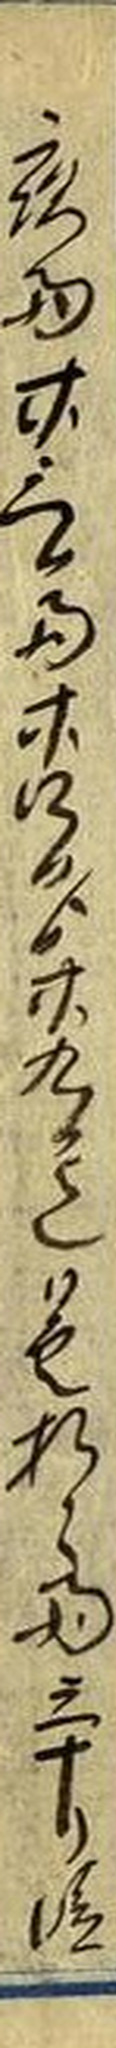夜雨廿三日雨廿四日ゟ廿九日迄曇折々雨三十日晴
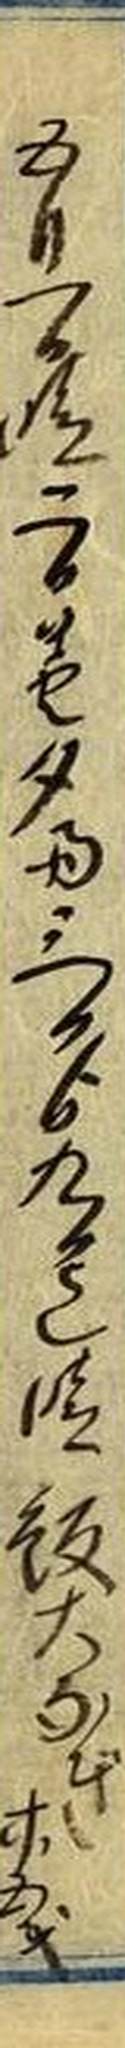五月一日晴二日曇夕雨三日ゟ九日迄晴魬大なぎ廿五も
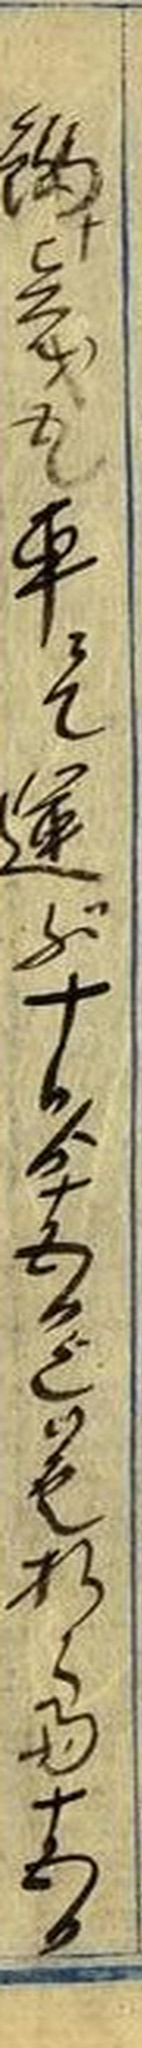鰯ヲ壱斗五勺車にて運ぶ十日ゟ十五日迄曇折々雨十五日
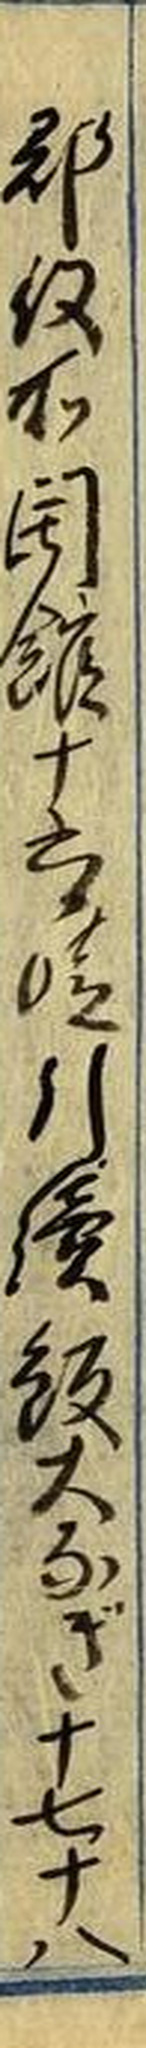郡役所開館十六日晴引続魬大なぎ十七十八
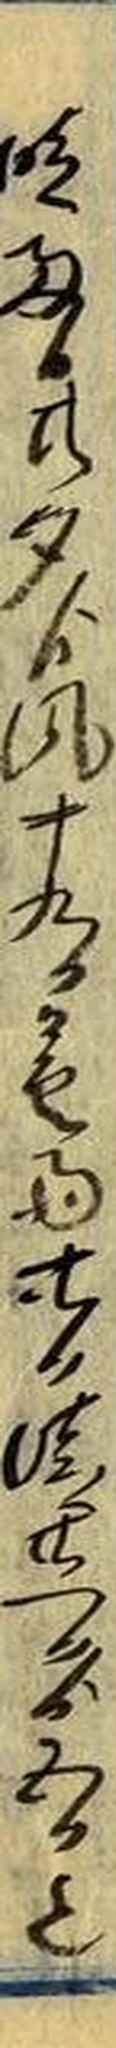晴両日共夕ゟ風十九日曇雨廿日晴廿一日ゟ五日迄
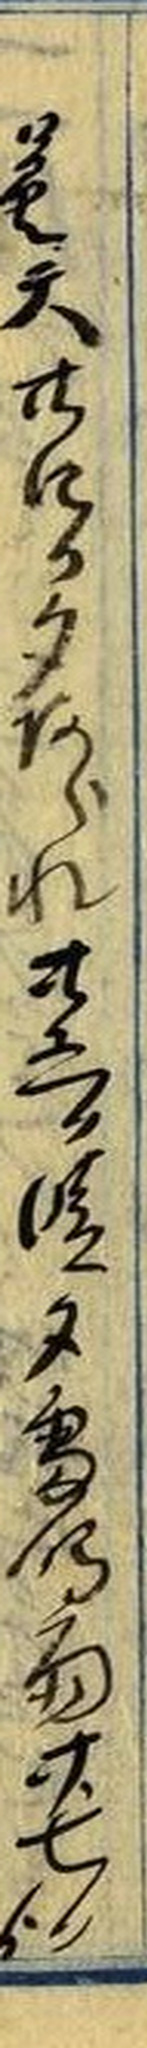曇天廿四日夕あられ廿六日晴夕雷鳴雨廿七日ゟ
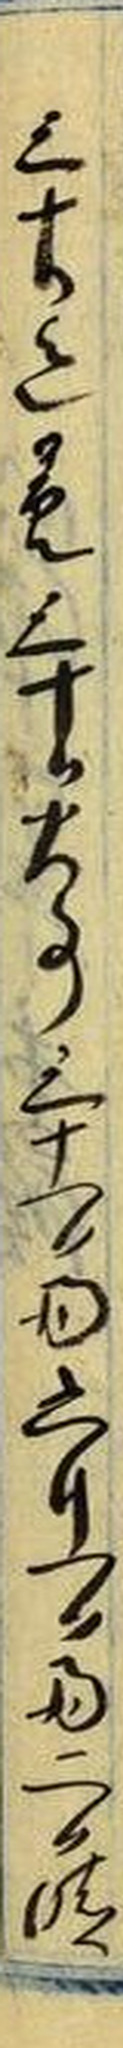三十日迄曇三十日火事三十一日雨六月一日雨二日晴
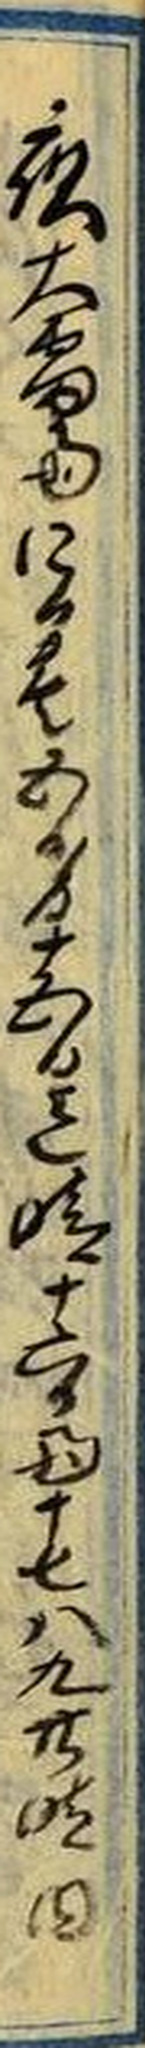夜大雷雨四日曇五日ゟ十五日迄晴十六日雨十七八九共晴内
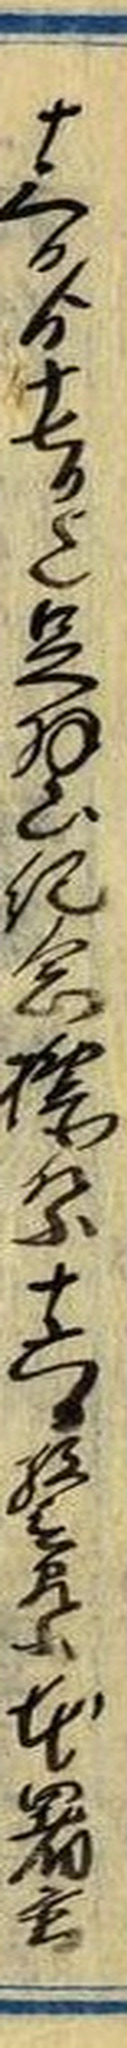十三日ゟ十七日迄足羽山記念標祭十六日警察本署普
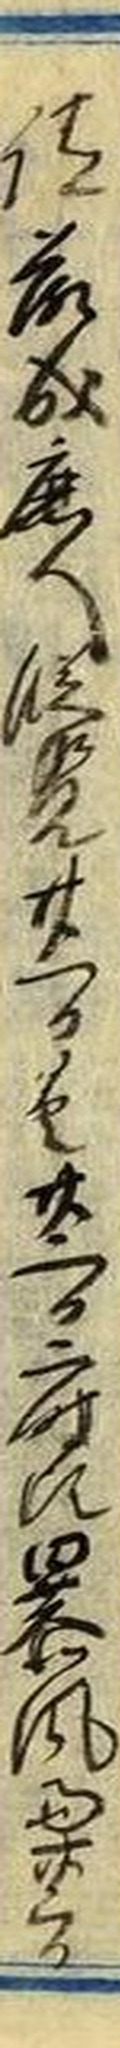請落成庶人縦覧廿一日曇廿二日二時頃暴風雨廿二日
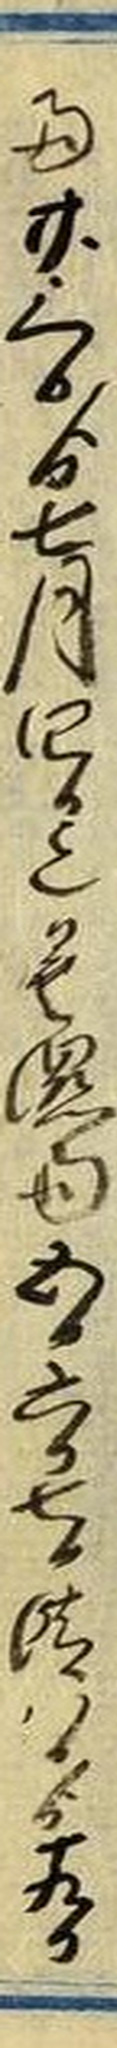雨廿三日ゟ七月四日迄曇湿雨五日六日七日晴八日ゟ十九日
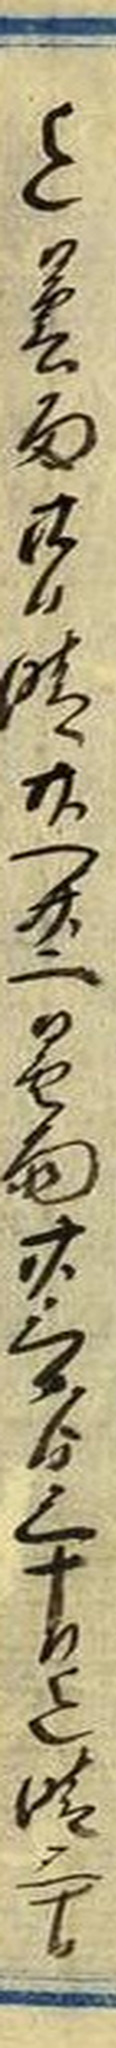迄曇雨廿日晴廿一廿二曇雨廿三日ゟ三十日迄晴三十日
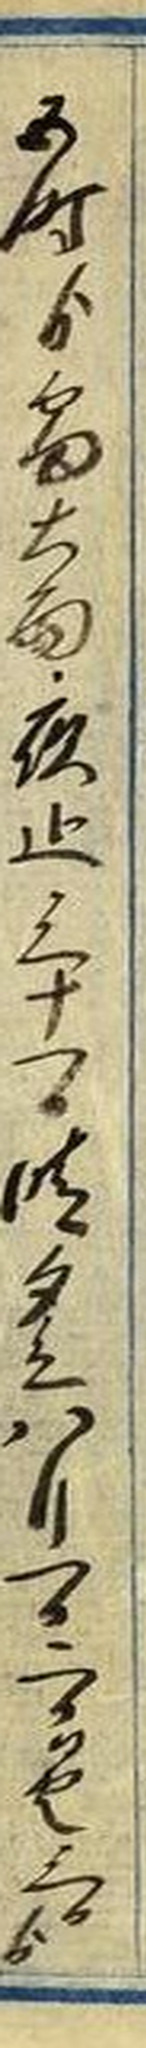五時ゟ雷大雨夜止三十一日晴夕立八月一日二日曇三日ゟ
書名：温古集 五巻
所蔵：福井県文書館 Fukui Prefectural Archives
